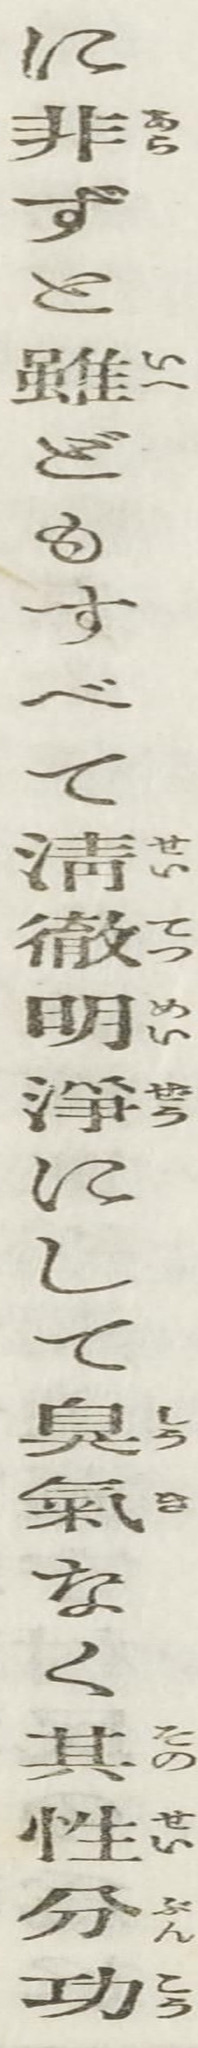に非ずと雖どもすべて清徹明浄にして臭氣なく其性分功
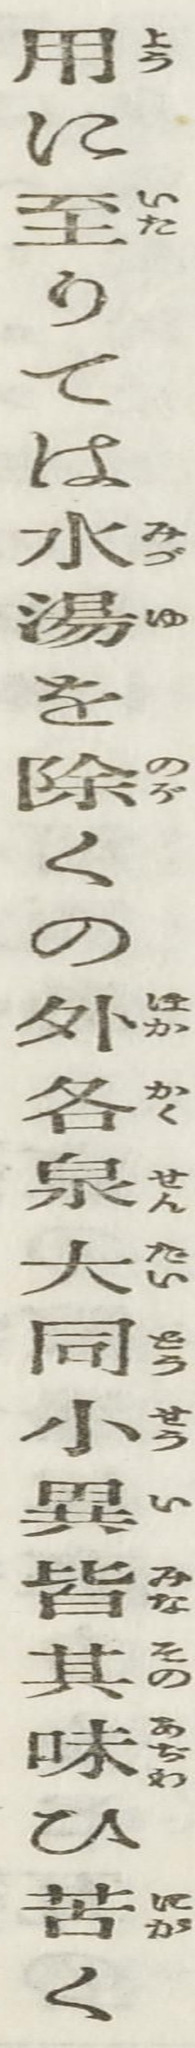用に至りては水湯を除くの外各泉大同小異皆其味ひ苦く
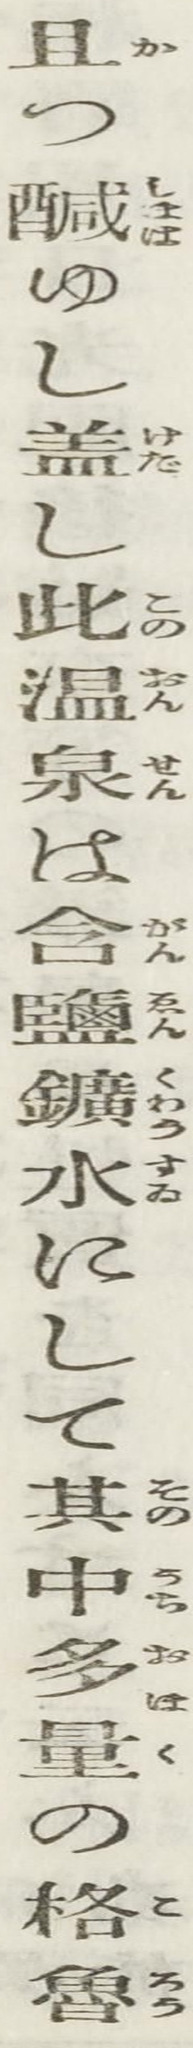且つ醎ゆし蓋し此温泉は含鹽鑛水にして其中多量の格魯
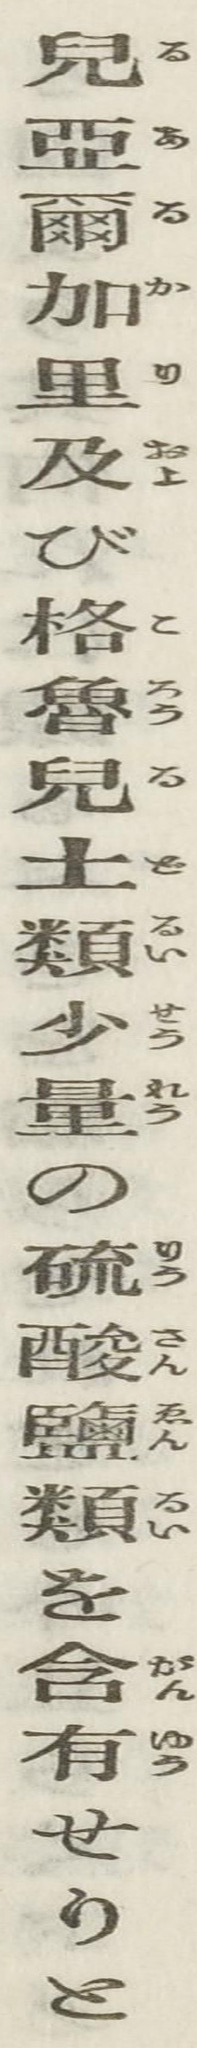兒亞爾加里及び格魯兒土類少量の硫酸鹽類を含有せりと
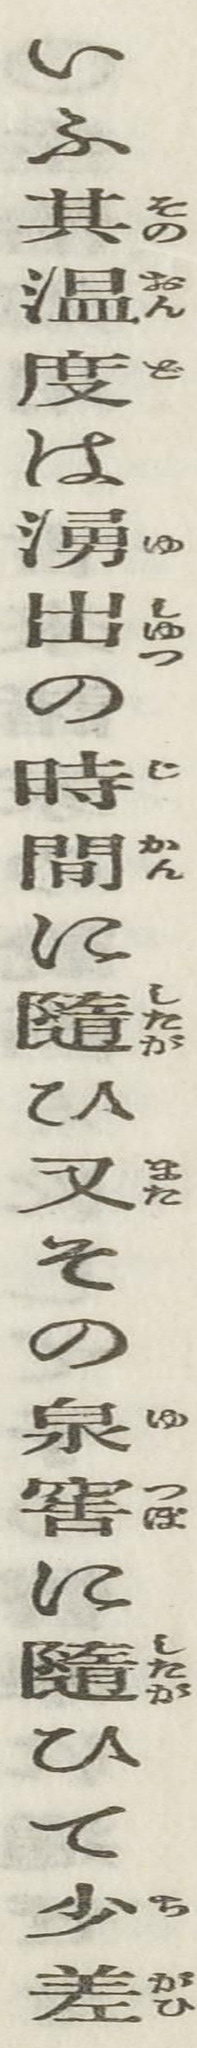いふ其温度は湧出の時間に随ひ又その泉窖に随ひて少差
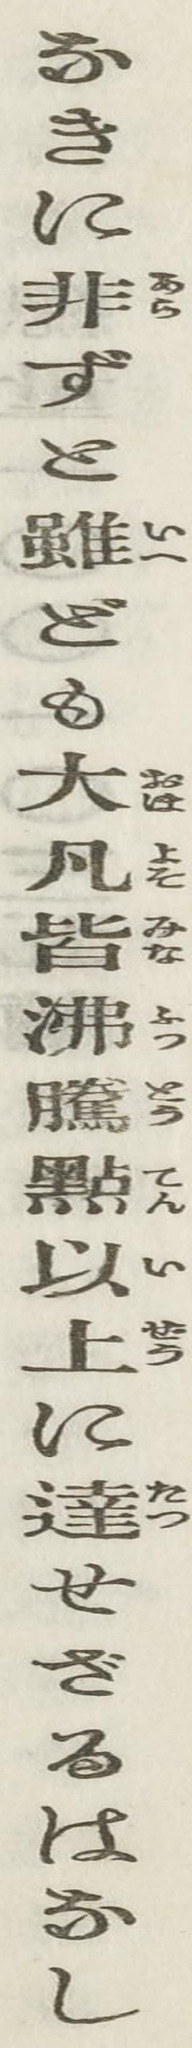なきに非ずと雖ども大凡皆沸騰點以上に達せざるはなし
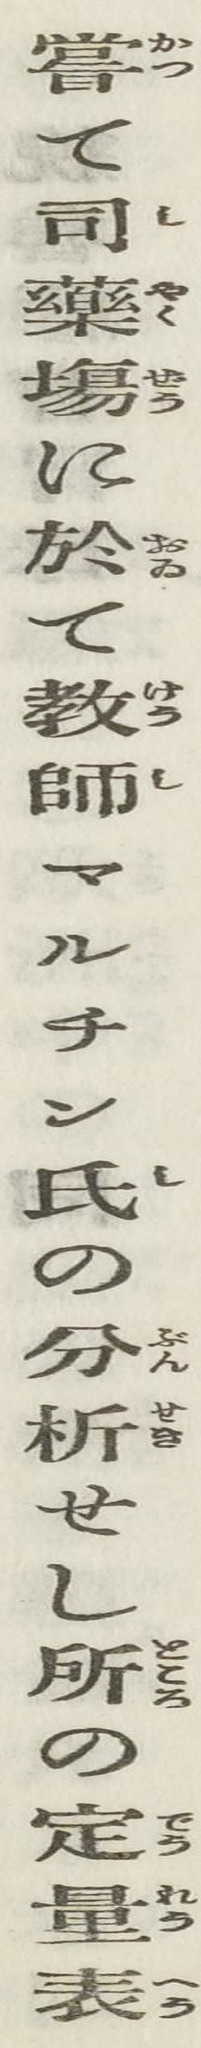嘗て司薬場に於て教師マルチン氏の分析せし所の定量表
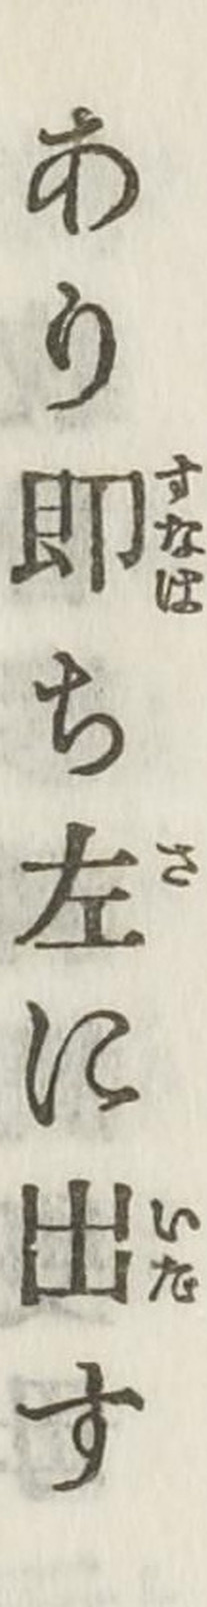あり即ち左に出す
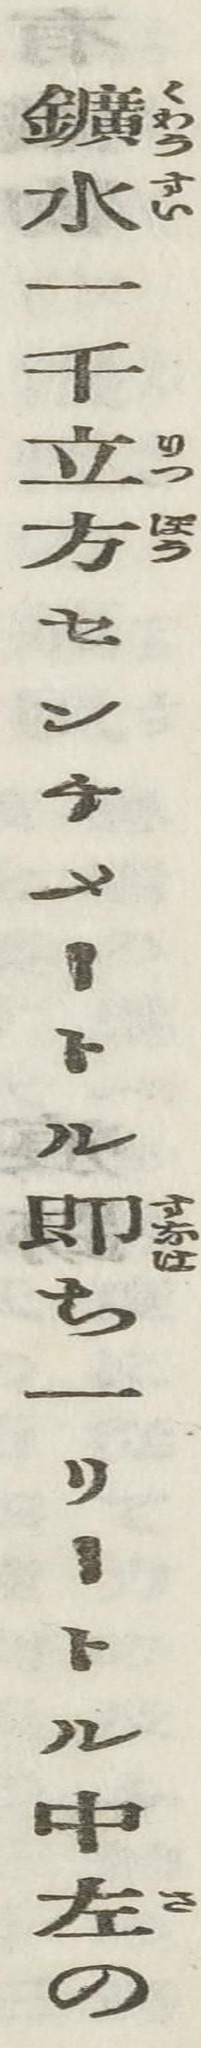鑛水一千立方センチメートル即ち一リートル中左の
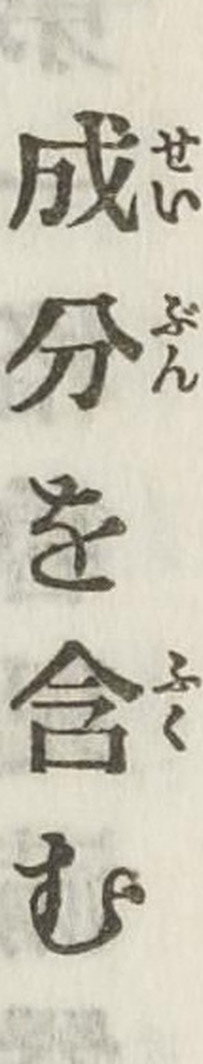成分を含む

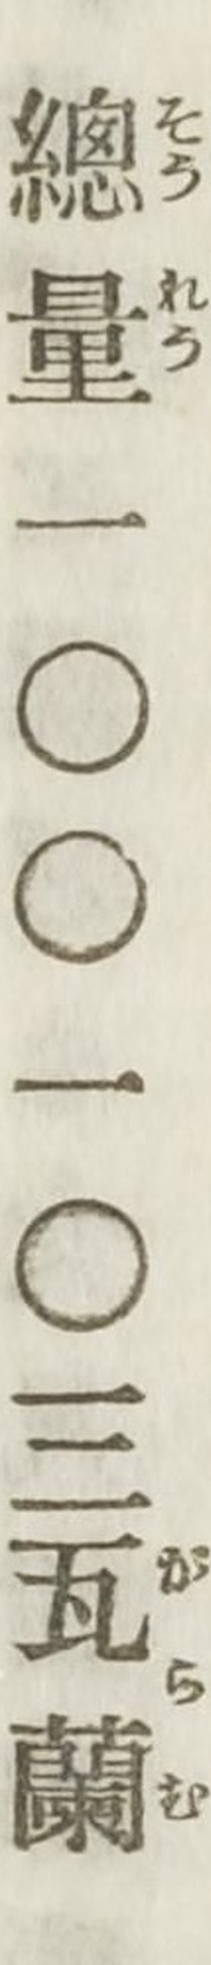総量一〇〇一〇三瓦蘭
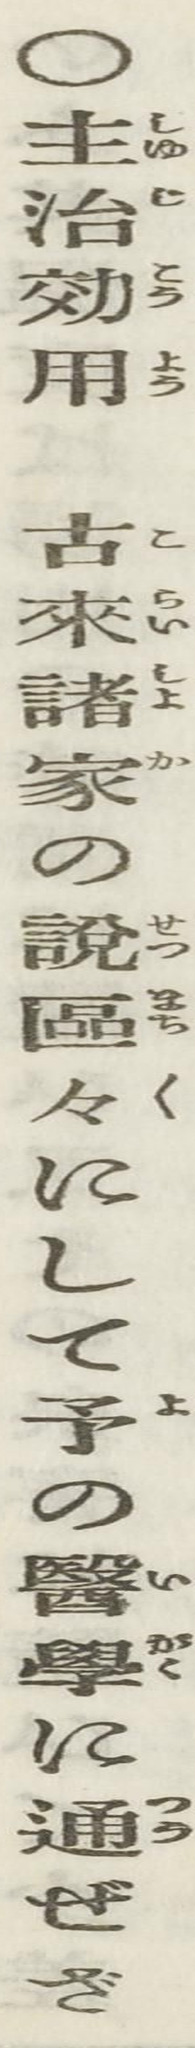○主治効用古来諸家の説区々にして予の醫學に通ぜざ
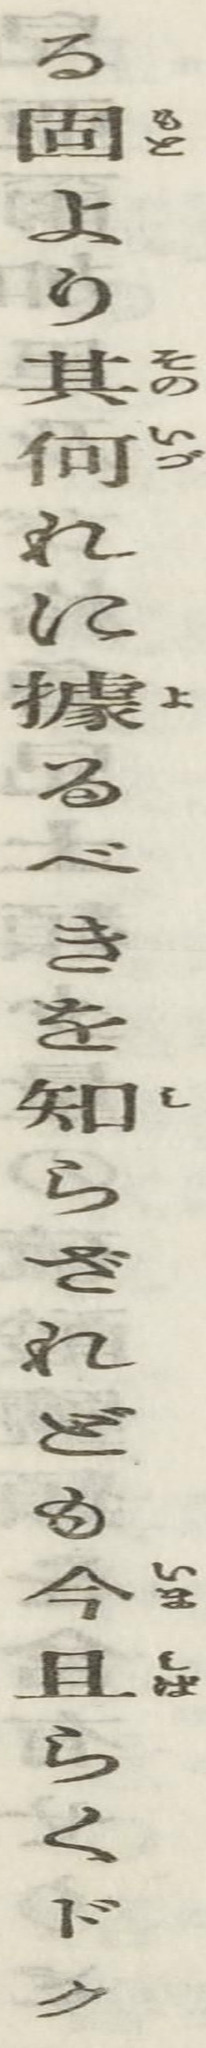る固より其何れに據るべきを知らざれども今且らくドク
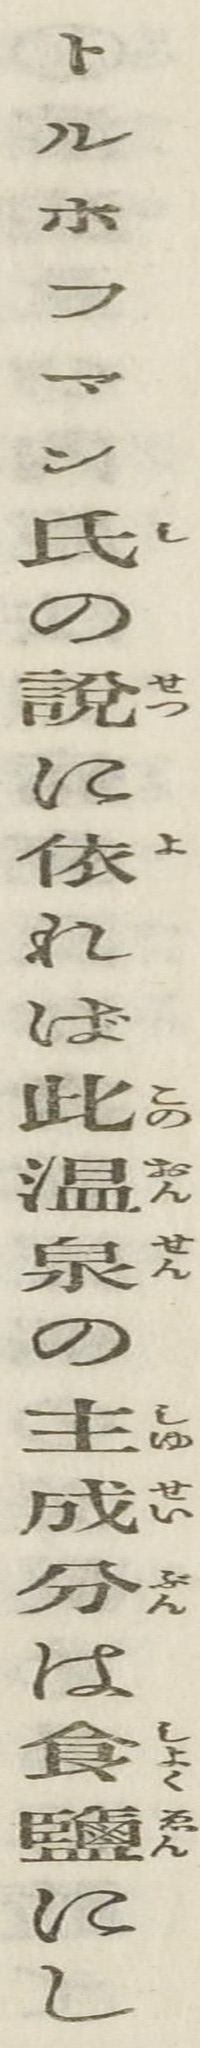トルホフマン氏の説に依れば此温泉の主成分は食鹽にし
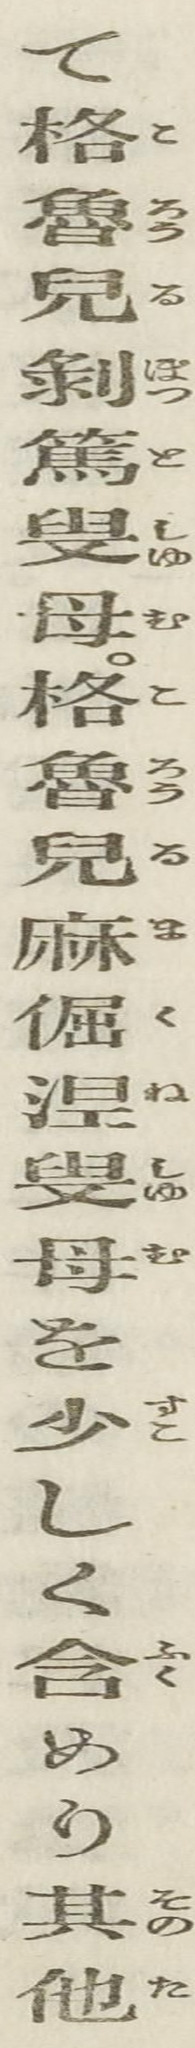て格魯兒剝篤叟母。格魯兒麻倔涅叟母を少しく含めり其他
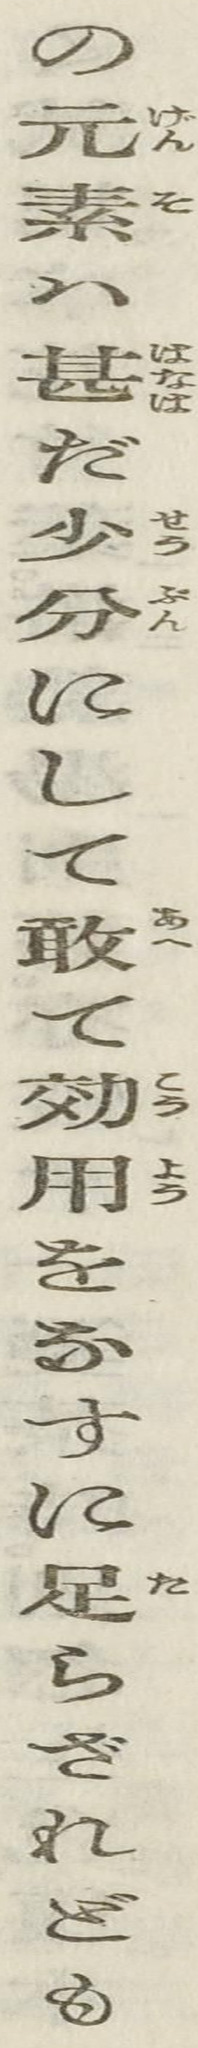の元素は甚だ少分にして敢て効用をなすに足らざれども
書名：熱海獨案内　全
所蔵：東京大学地震研究所図書室 Earthquake Research Institute Library, The University of Tokyo, JAPAN
